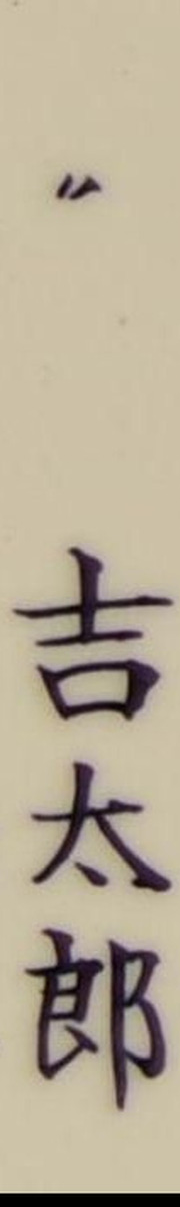吉太郎
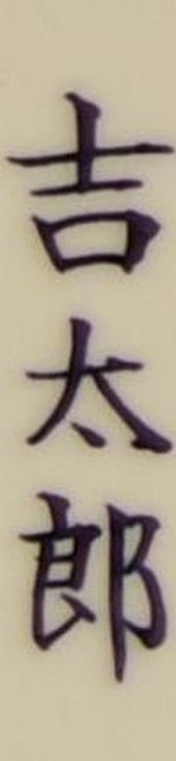吉太郎
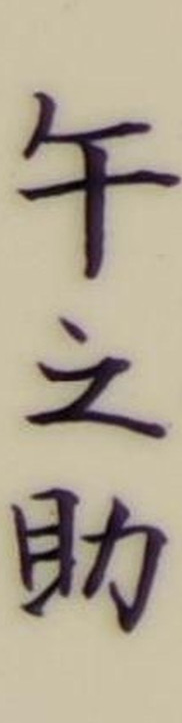午之助

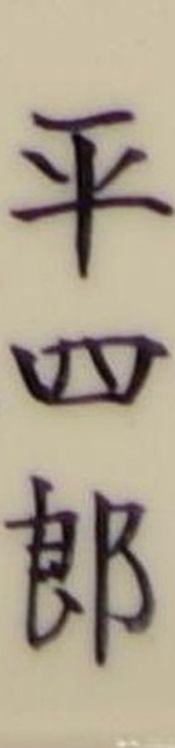平四郎
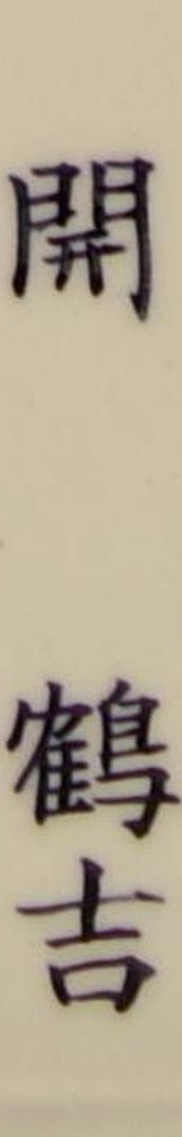開鶴吉
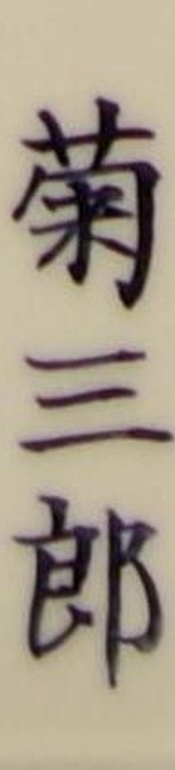菊三郎
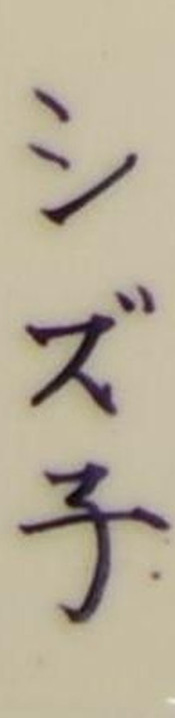シズ子

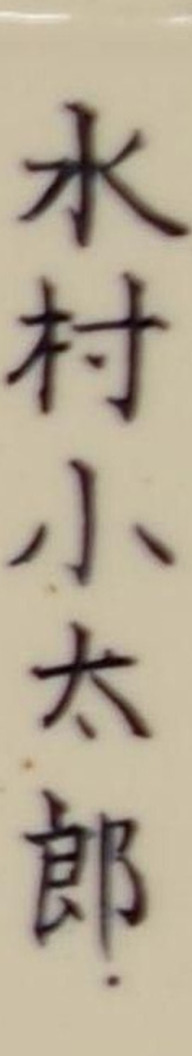水村小太郎
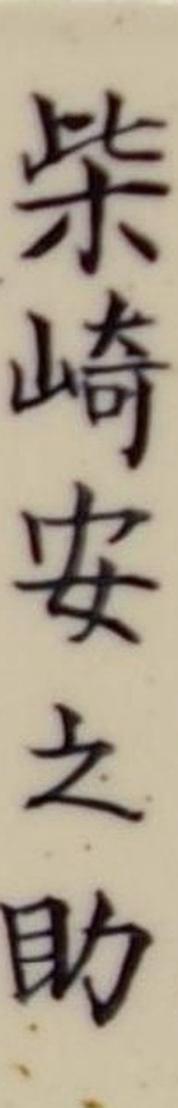柴崎安之助
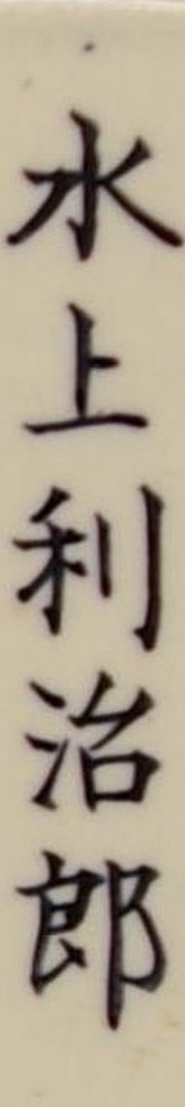水上利治郎
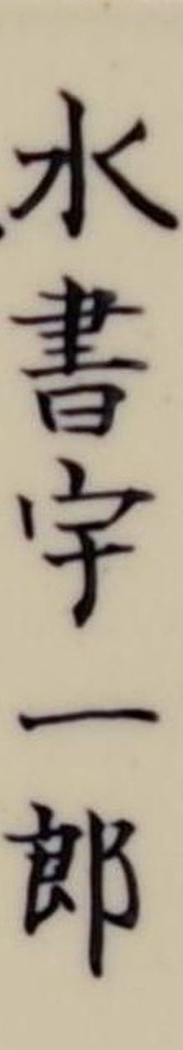水書宇一郎
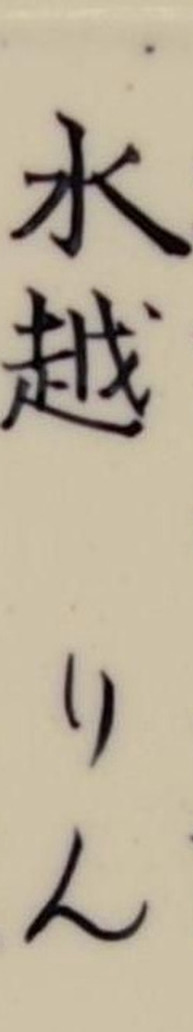水越りん
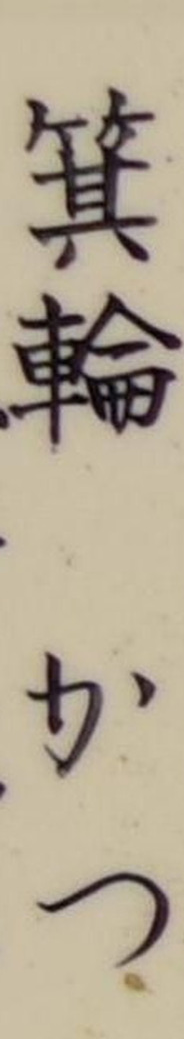箕輪かつ
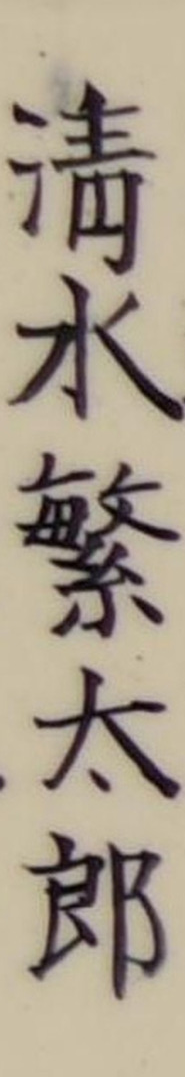清水繁太郎
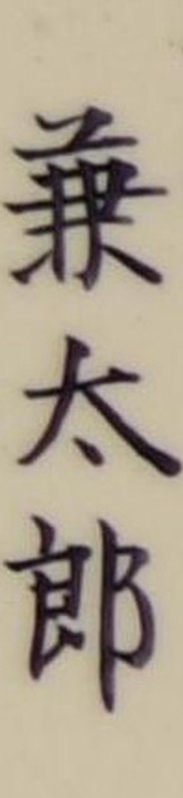兼太郎

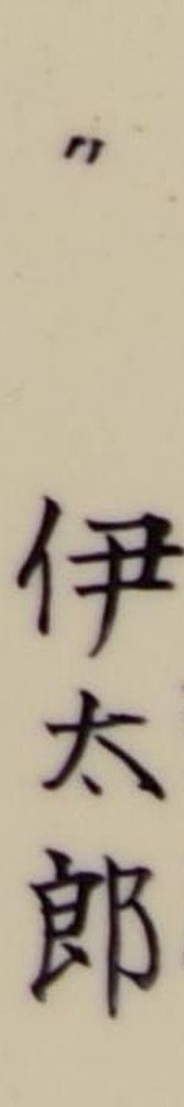伊太郎
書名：E~L
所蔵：高野山金剛峯寺
